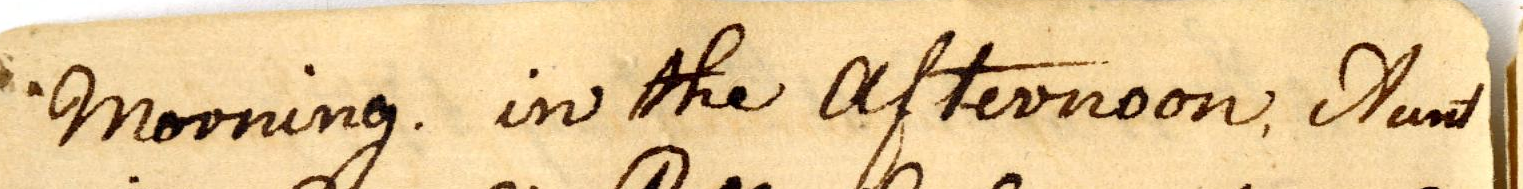Morning. in the Afternoon, Aunt
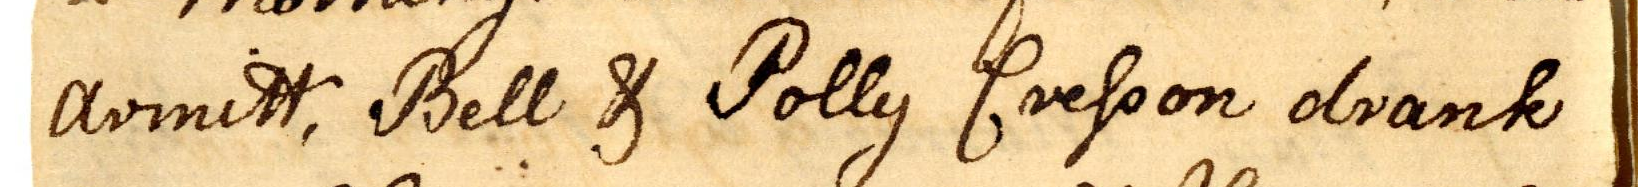Armitt, Bell & Polly Cresson drank
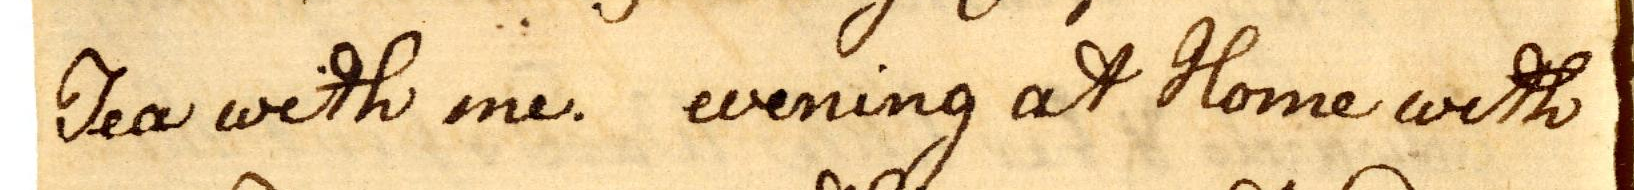Tea with me. evening at Home with
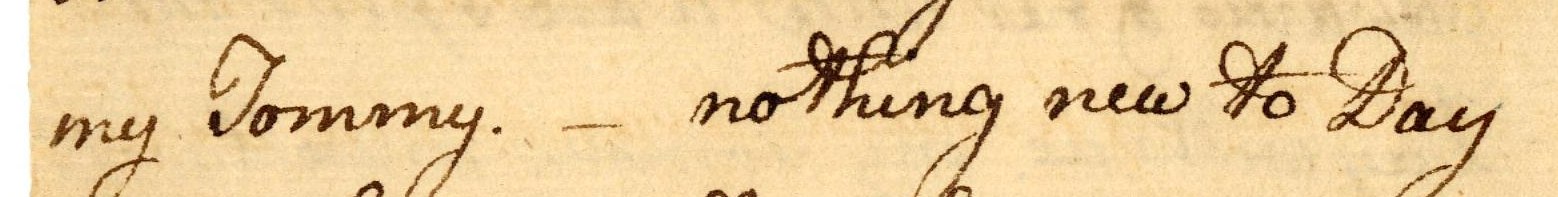my Tommy.- nothing new to Day
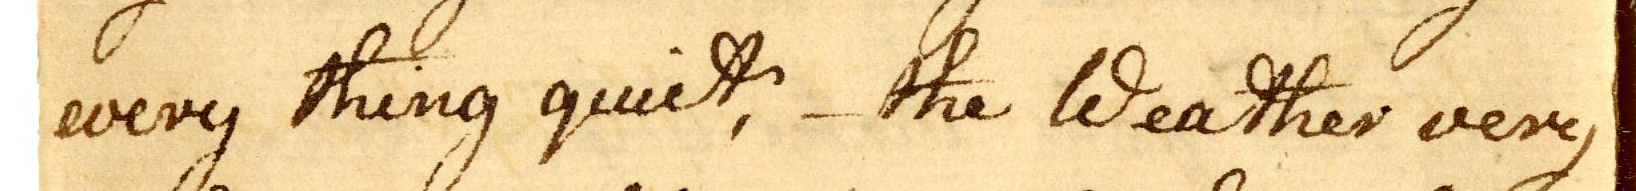every thing quiet,- the Weather very
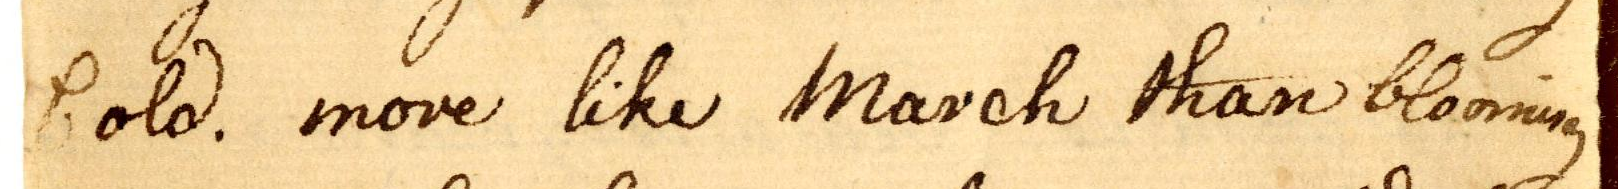Cold. more like March than blooming
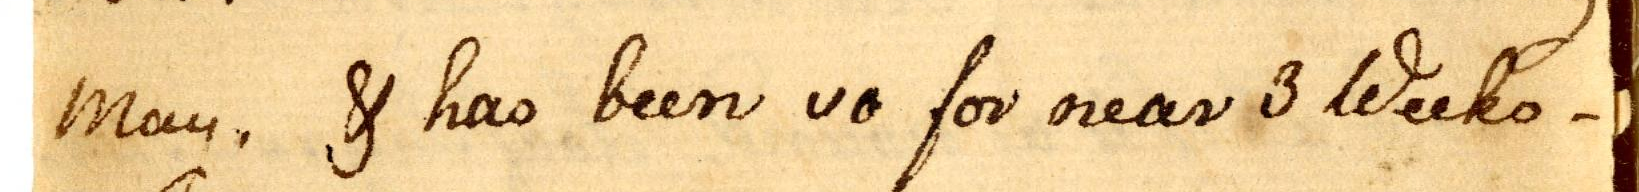May. & has been so for near 3 Weeks-
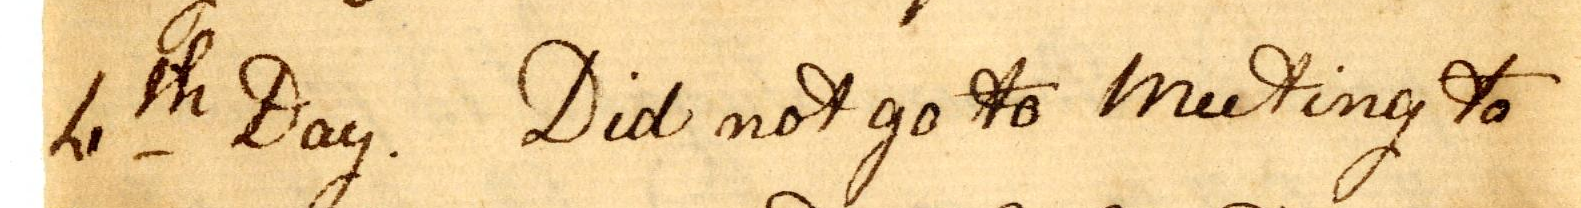4^th Day. Did not go to Meeting to
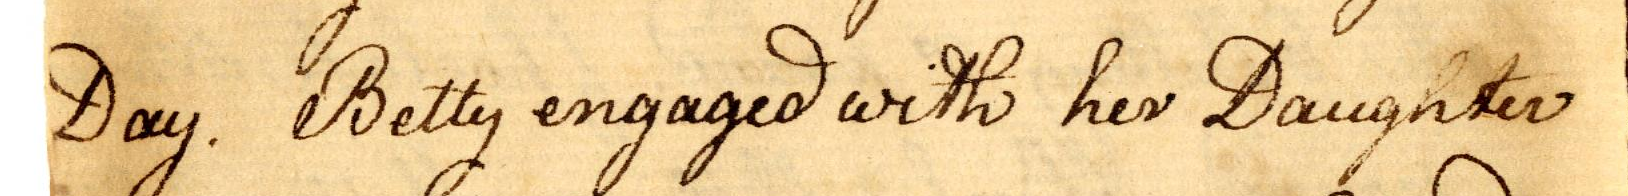Day. Betty engaged with her Daughter
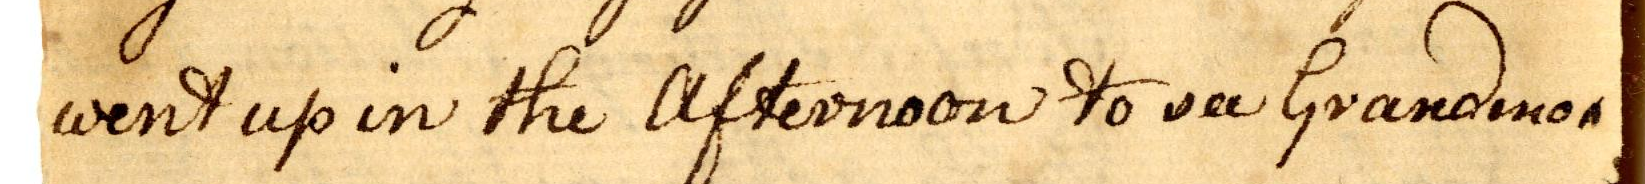went up in the Afternoon to see Grandmom
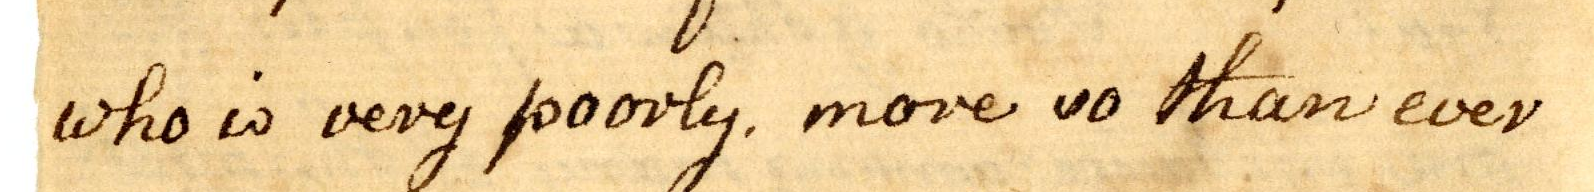who is very poorly. more so than ever
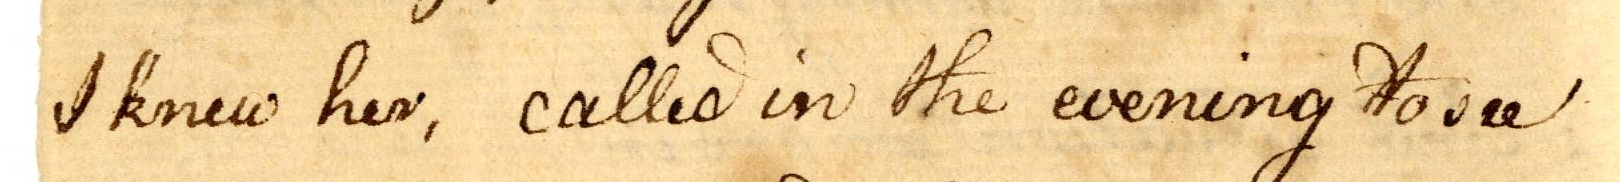I knew her, called in the evening to see
